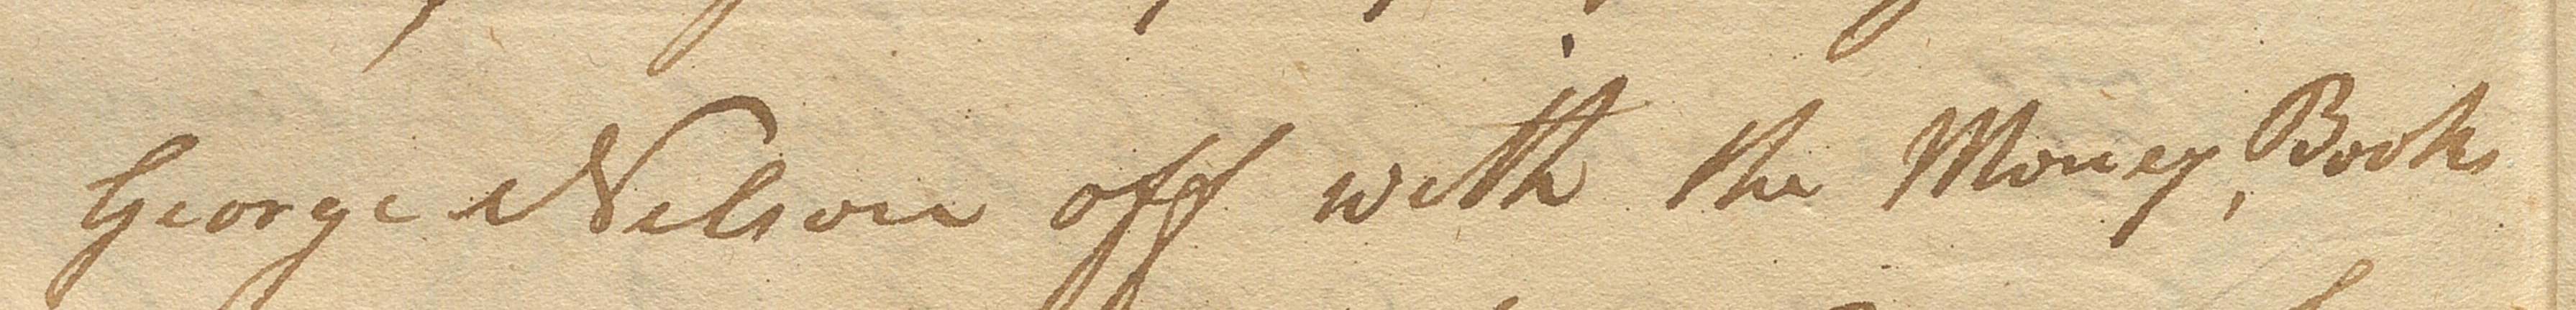George Nelson off with the Money Books
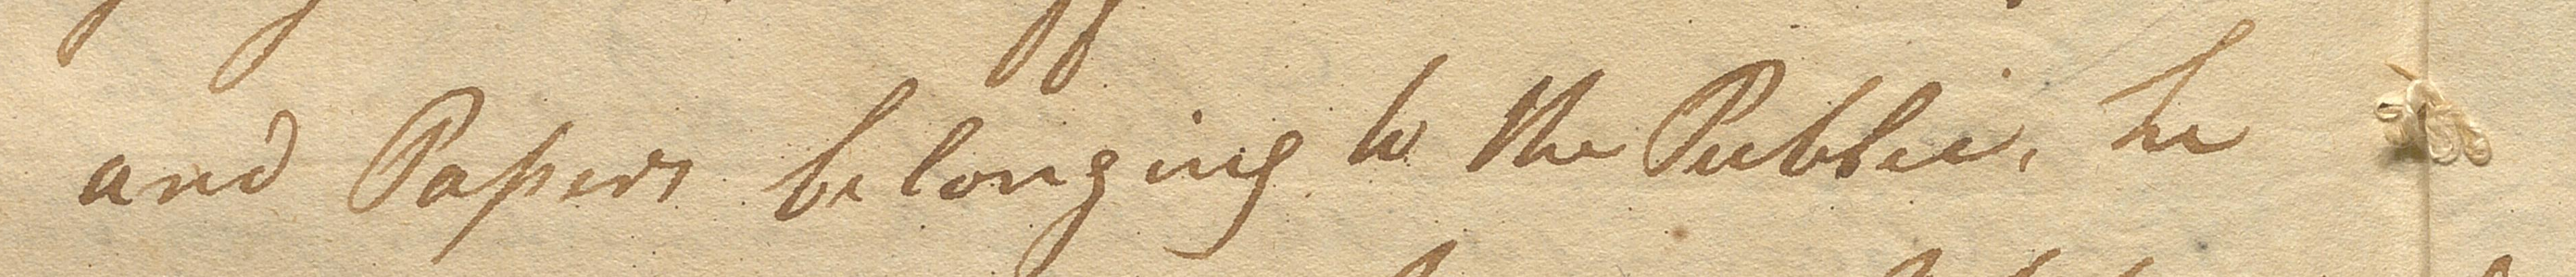and Papers belonging to the Public, he
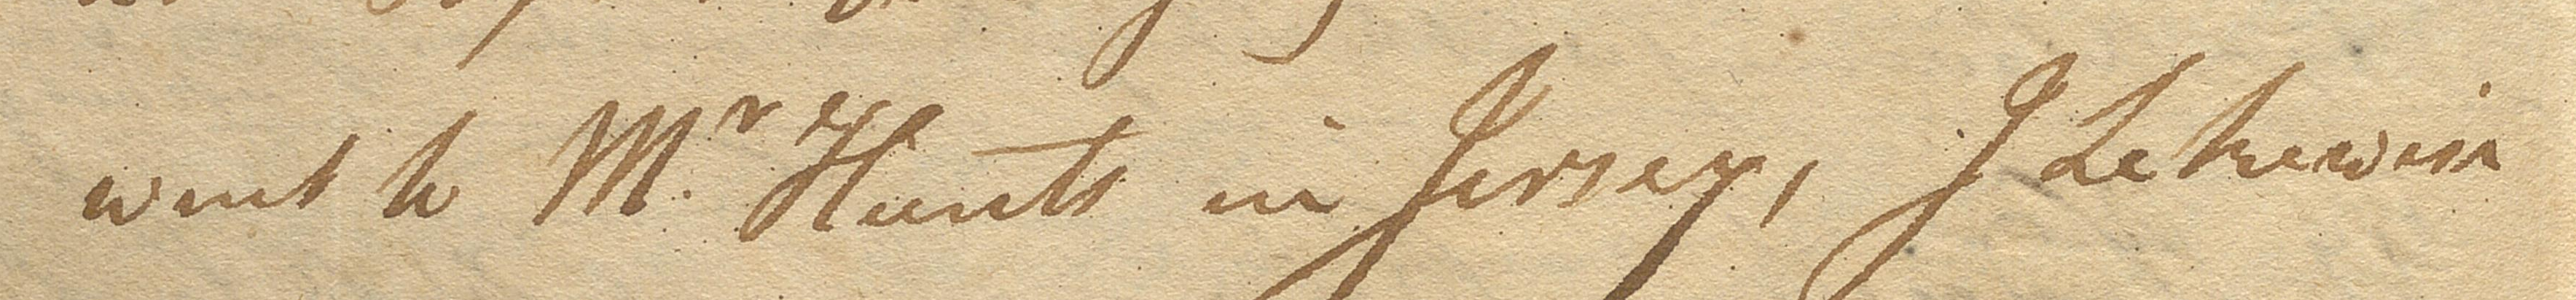went to M^r. Hunts in Jersey, I Likewise
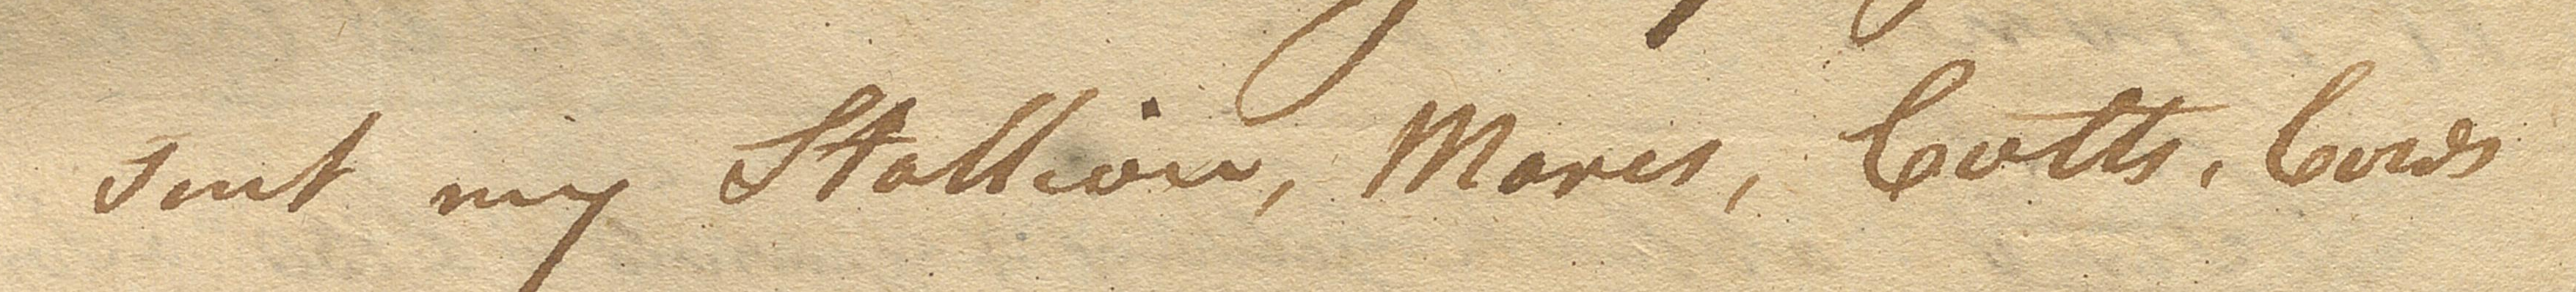sent my Stallion, Mares, Colts, Cows
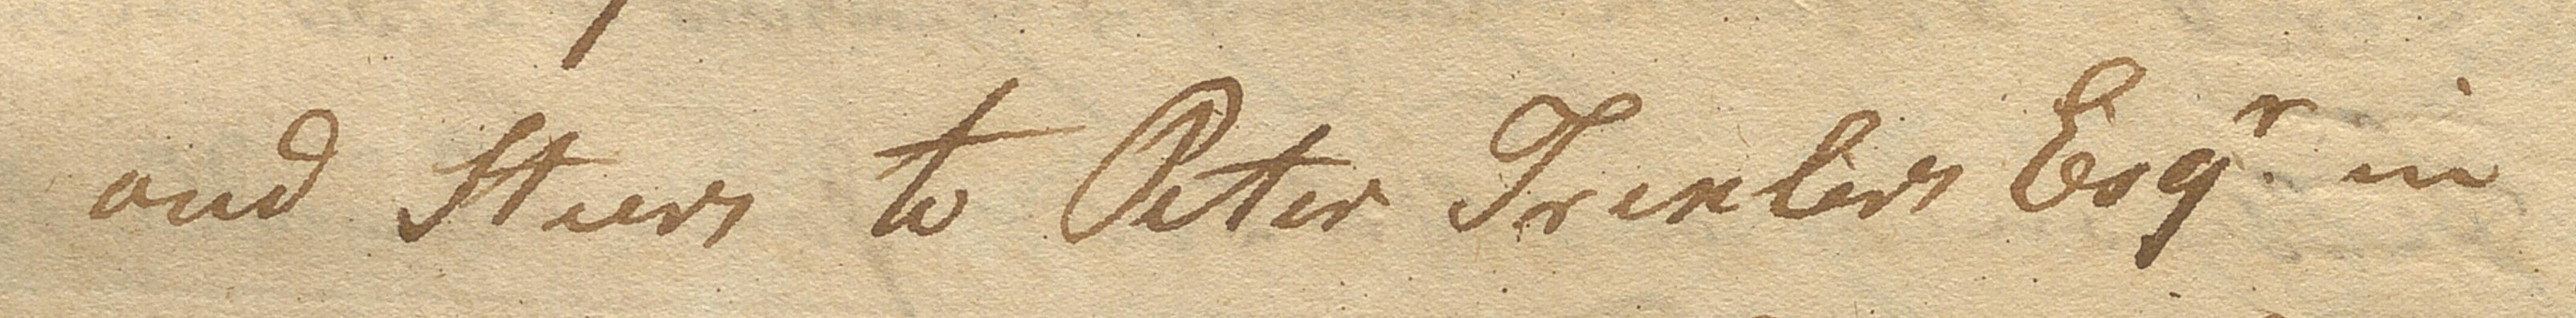and Stiers to Peter Trenlers Esq^r. in
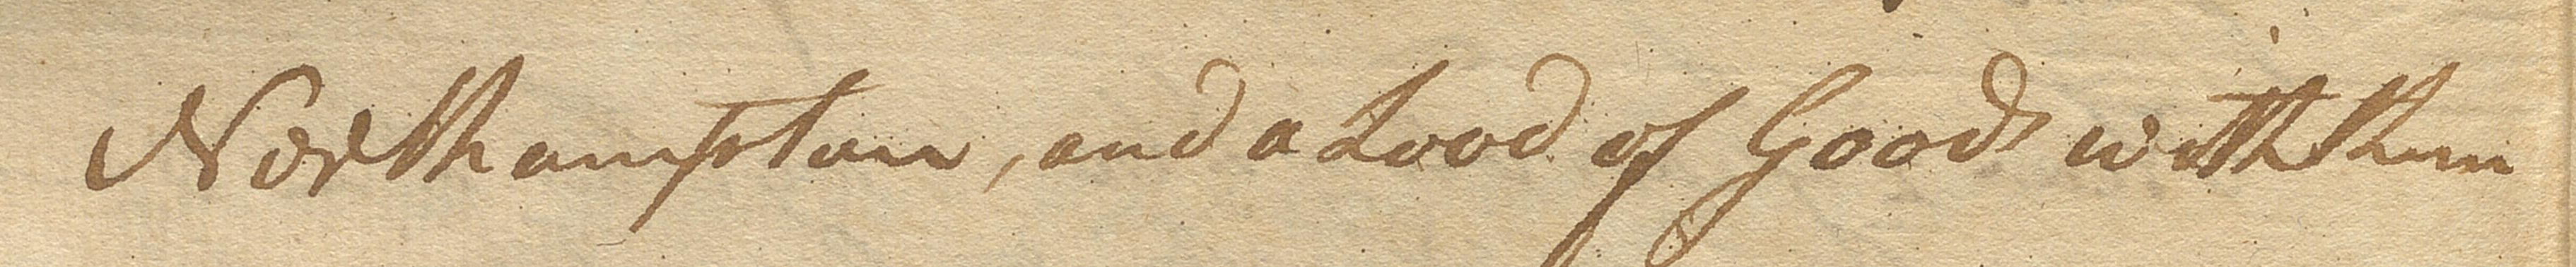Northampton, and a Load of Goods with them
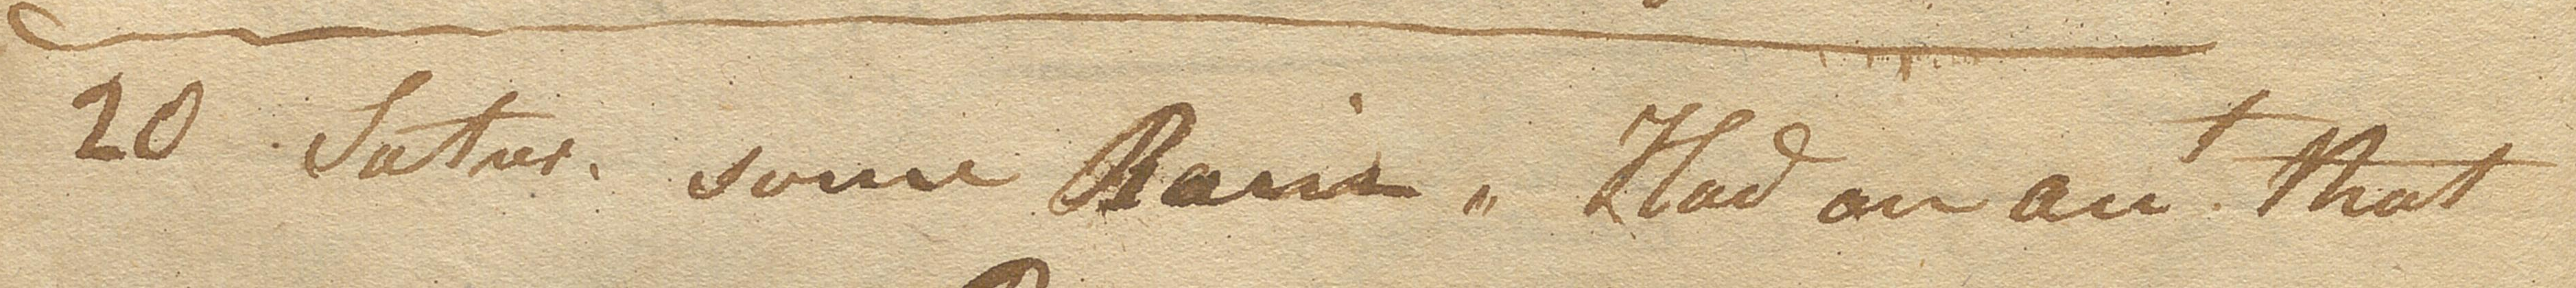20 Satur. some Rain. Had an acc^t. that
